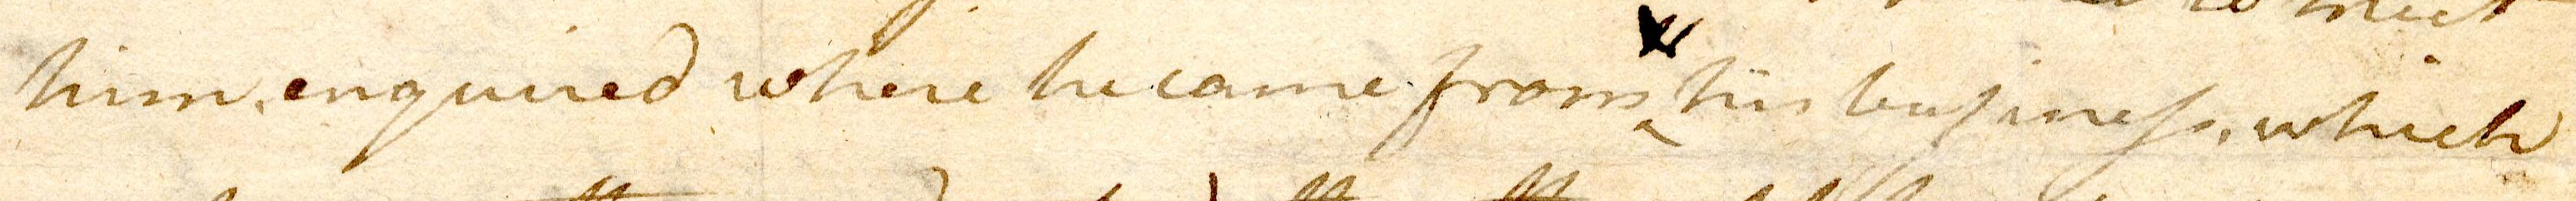him, enquired where he came from ^& his business, which
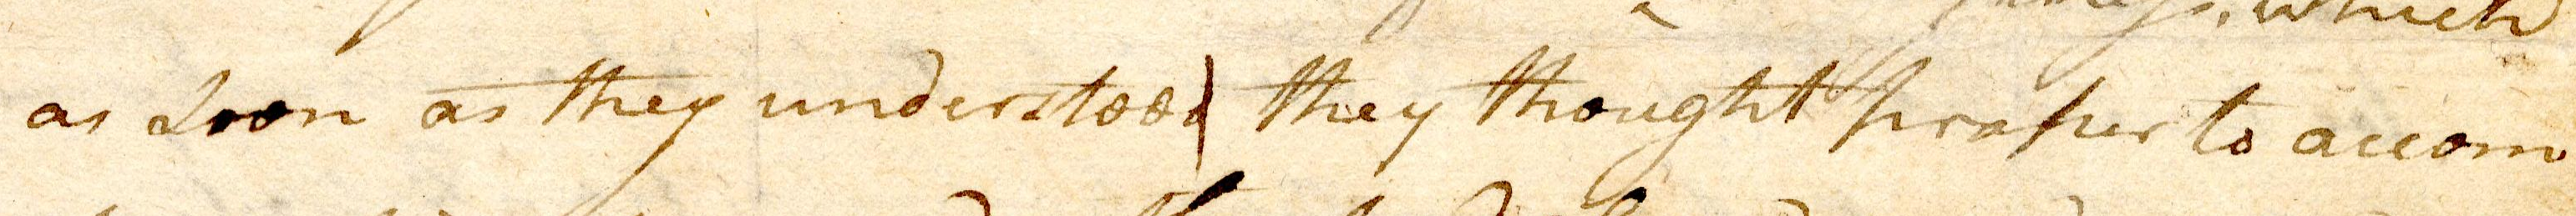as soon as they understood they thought proper to accom
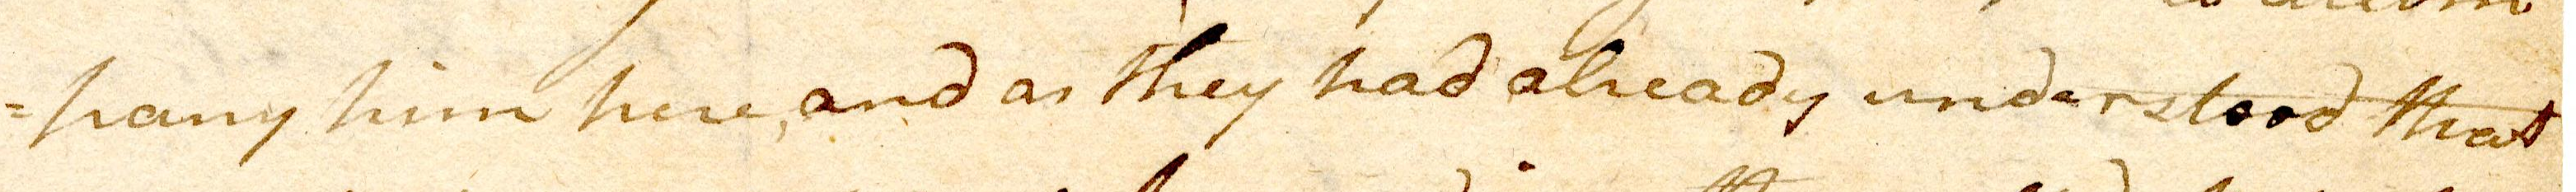-pany him here, and as they had already understood that
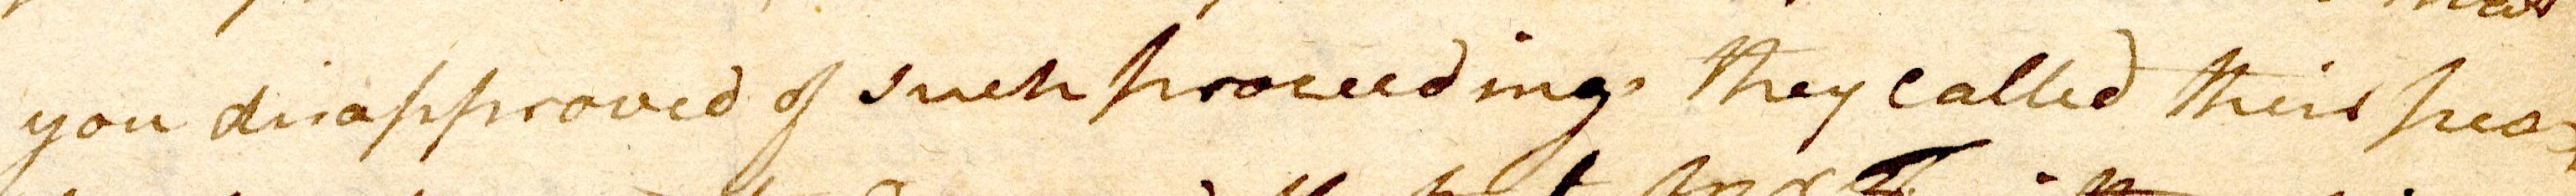you disapproved of such proceedings they called their peo
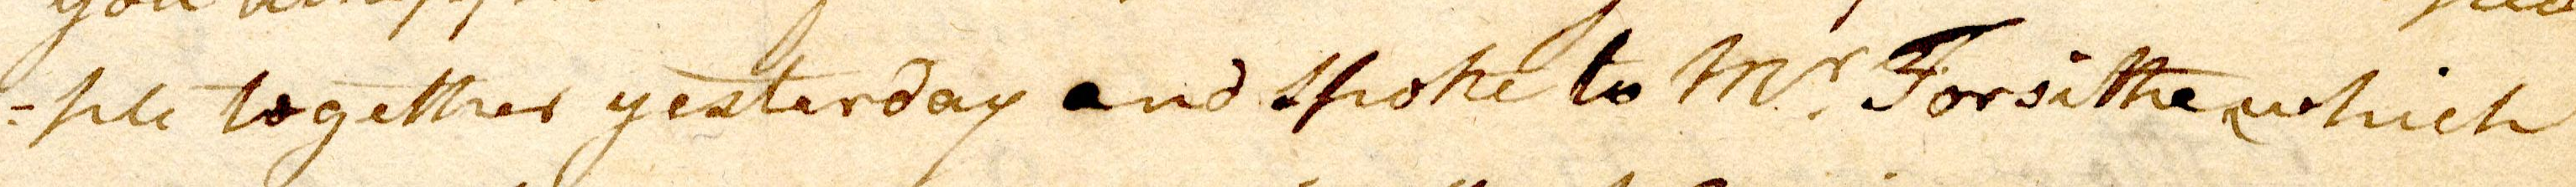-ple together yesterday and spoke to M^r. Forsithe, which
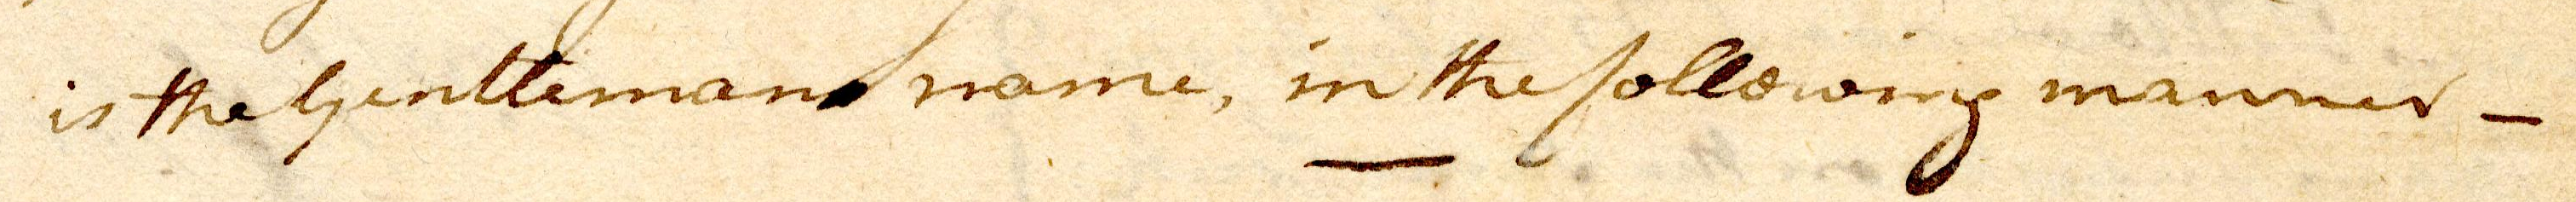is the Gentlemans name, in the following manner-
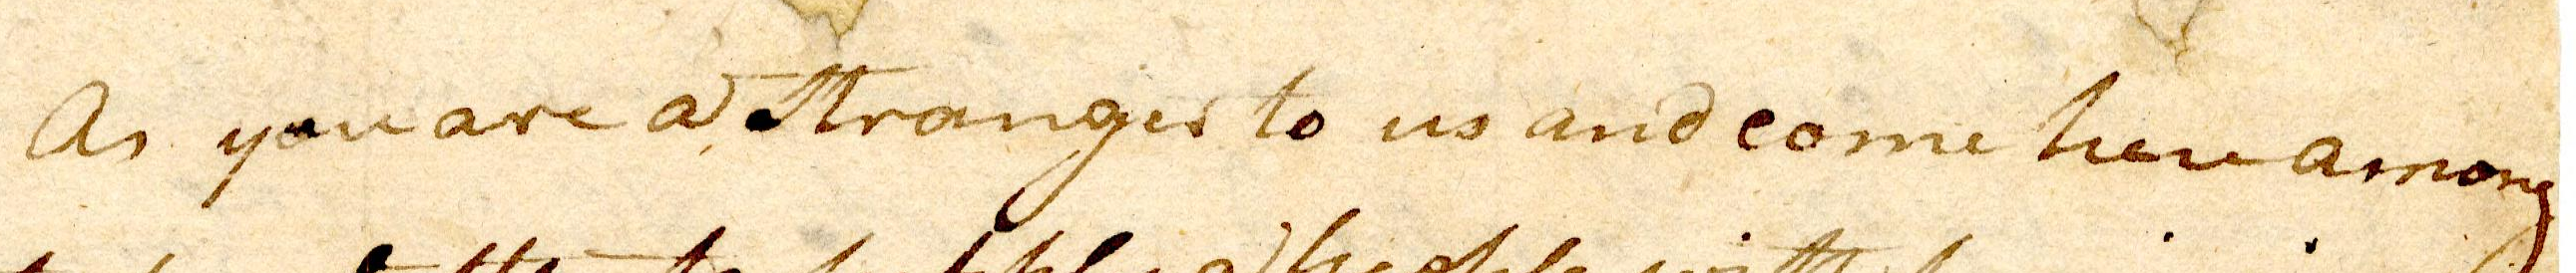As you are a stranger to us and come here among
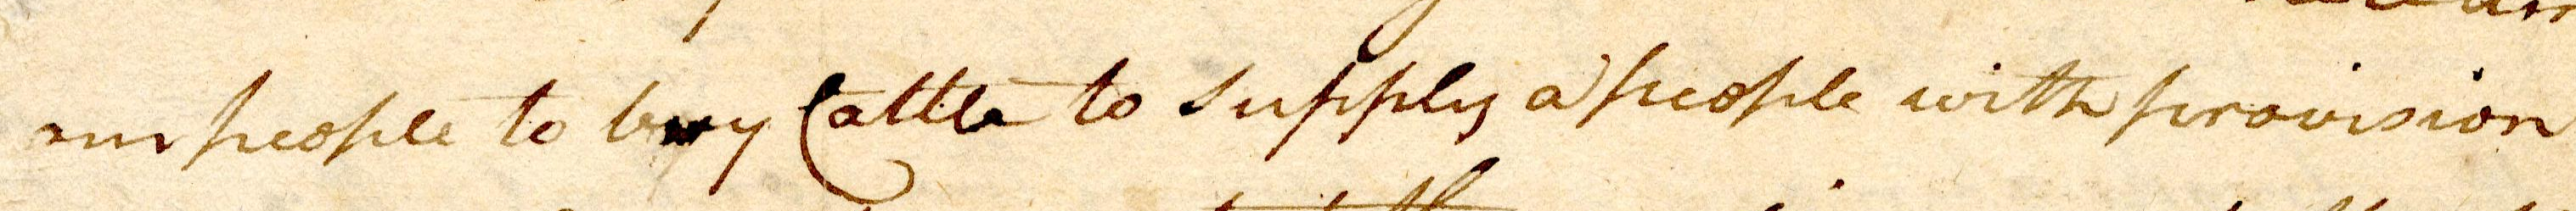our people to buy Cattle to supply a people with provision
